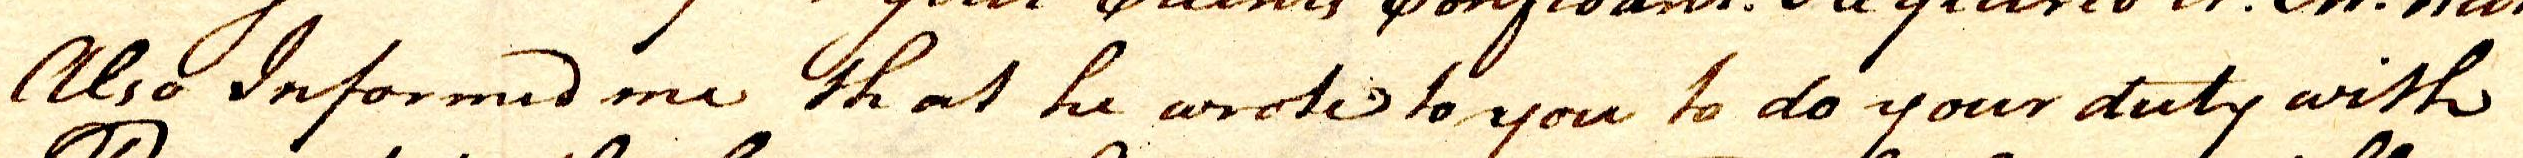Also Informed me that he wrote to you to do your duty with
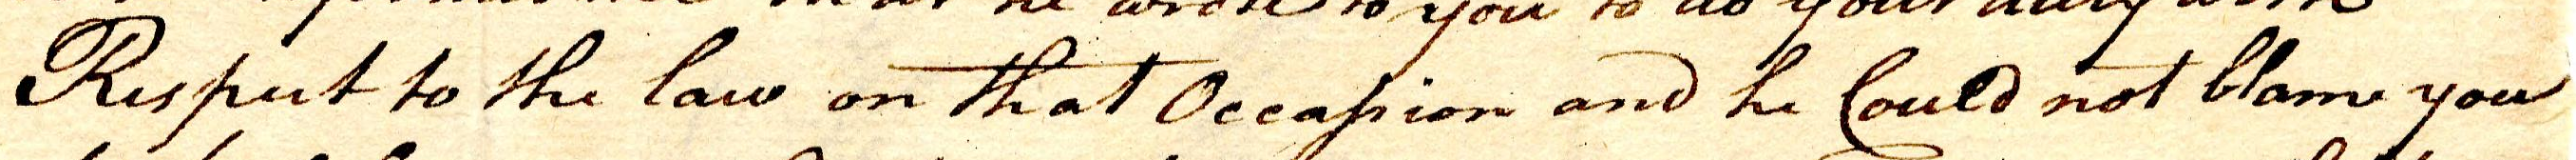Respect to the law on that occasion and he Could not blame you
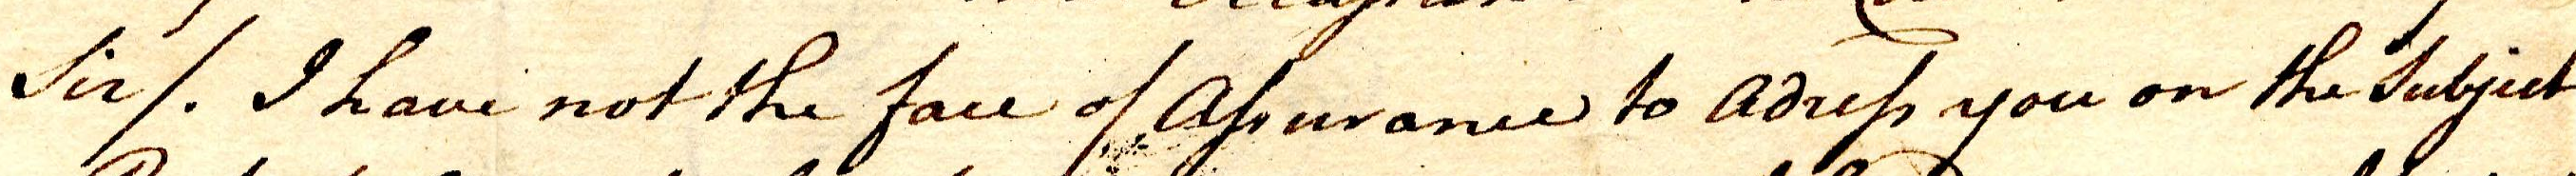Sir. I have not the face of Assurance to adress you on the Subject
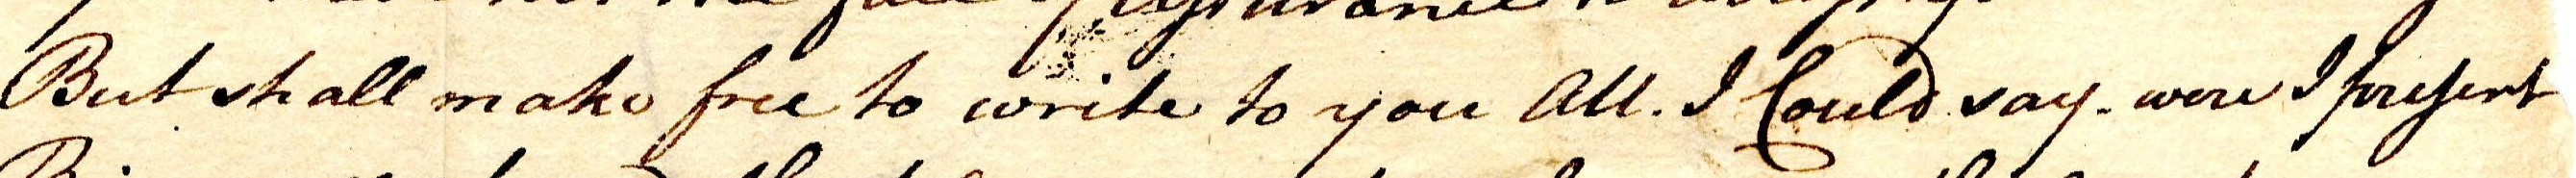But shall make free to write to you All. I Could say were I present
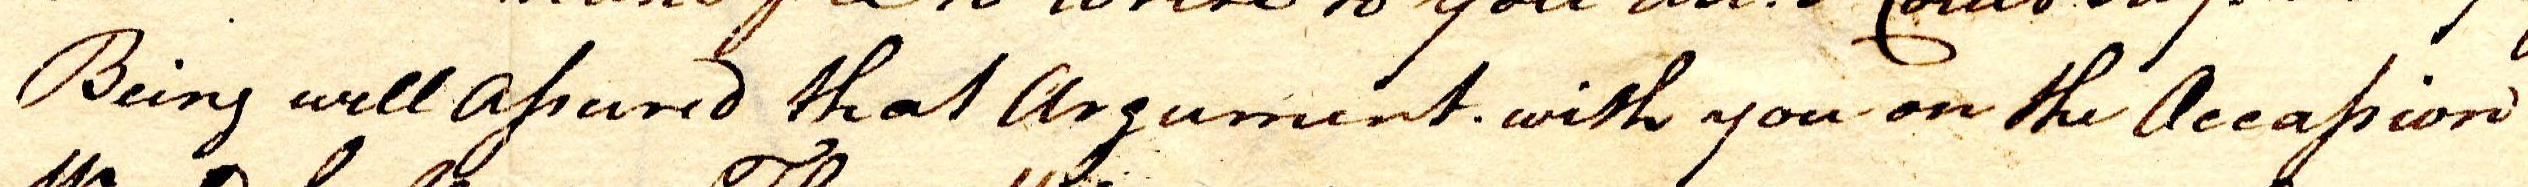Being well assured that Argument with you on the Occassion
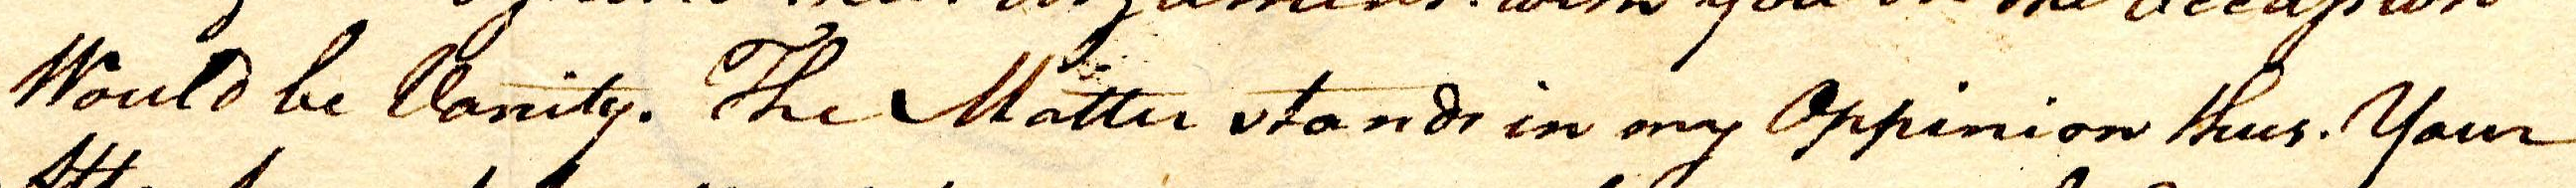Would be Vanity. The Matter stands in my Oppinion thus Your
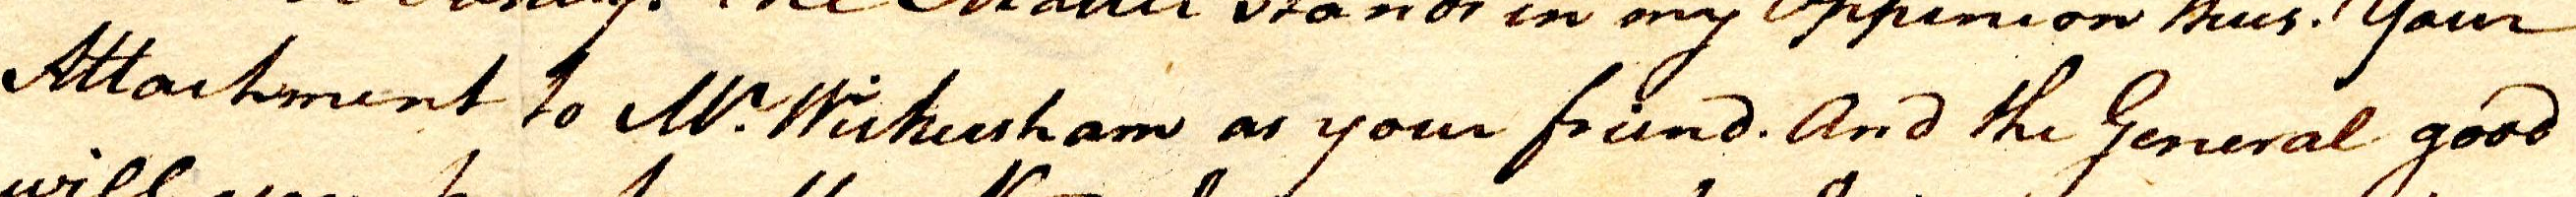Attachment to M^r. Wickersham as your friend. And the General good
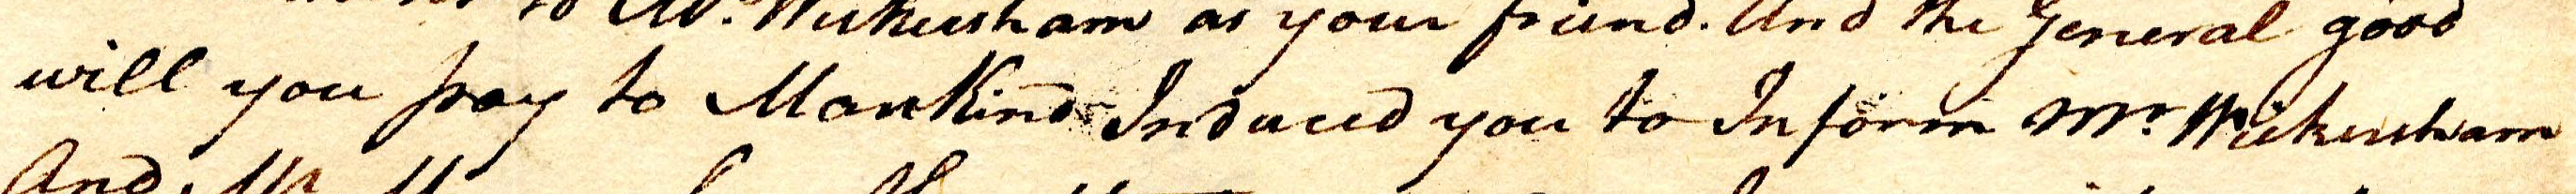will you pay to Mankind Induced you to Inform M^r. Wickersham
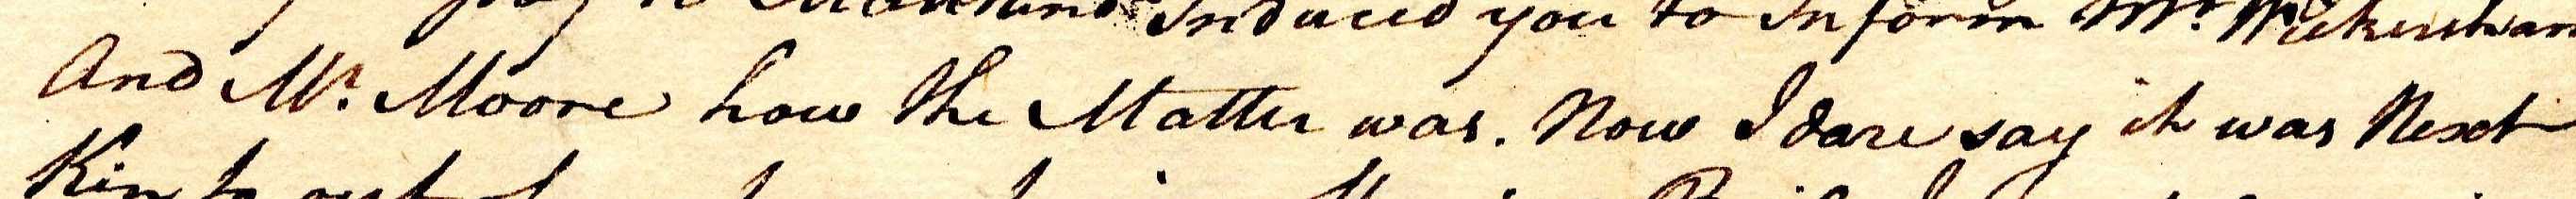And M^r. Moore how the Matter was. Now I dare say it was Next
